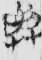與
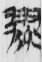鄝
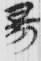昜（陽）
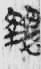執
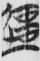疆
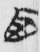西
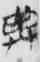與
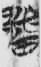鄱
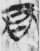君
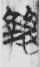執
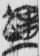疆
